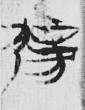俤（弟）
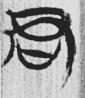君
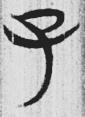子
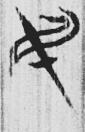民
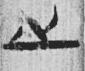之
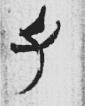父
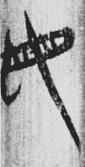母
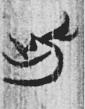此
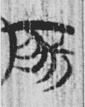所
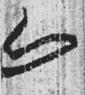㠯
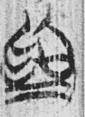爲
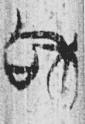和
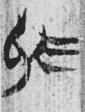於
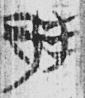邦
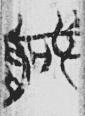○（莊）
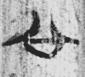公
